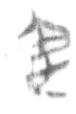思
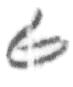㠯（以）
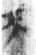天
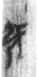張
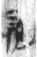則（則）
